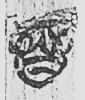晉
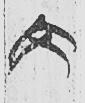文
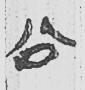公
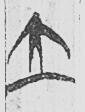立
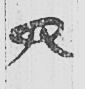四
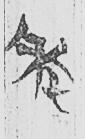年
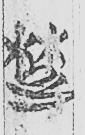楚
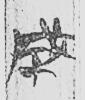成
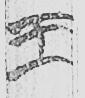王
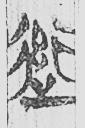{行幺止}
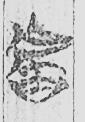者
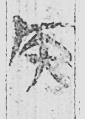侯
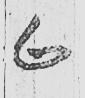㠯（以）
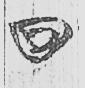回
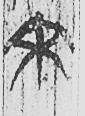宋
